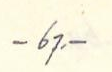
67
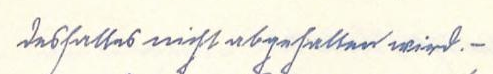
desfalles nicht abgehalten wird.
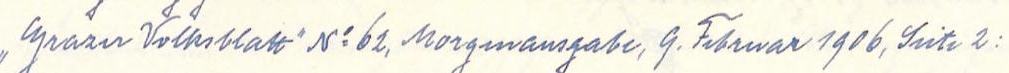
„Grazer Volksblatt“ Nr 62, Morgenausgabe, 9. Februar 1906, Seite 2:
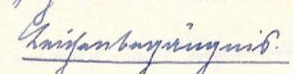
Leichenbegängnis
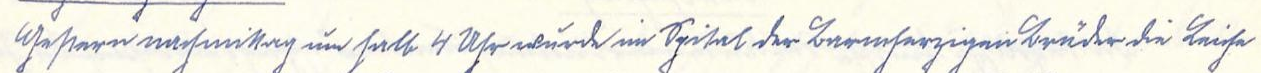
Gestern Nachmittag um halb 4 Uhr wurde im Spital der barmherzigen Brüder die Leiche
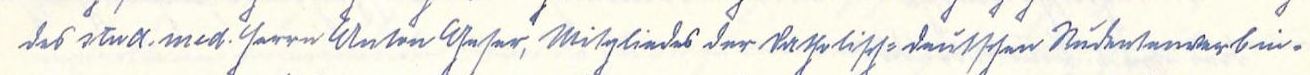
des stud. med. Herrn Anton Geser, Mitglied der katholisch-deutschen Studentenverbin-
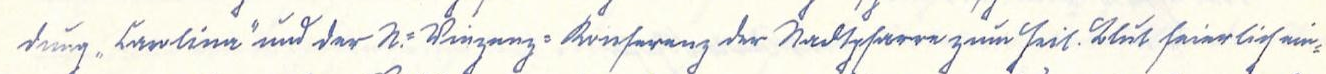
dung „Carolina“ und der St. Vinzenz-Konferenz der Stadtpfarre zum heil. Blut feierlich ein –
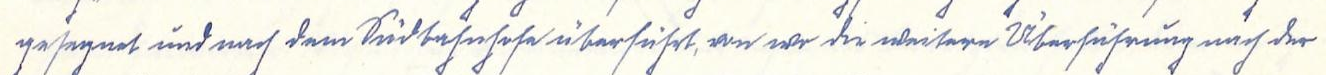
gesegnet und nach dem Südbahnhofe überliefert, überführt, von wo die weitere Überführung nach der
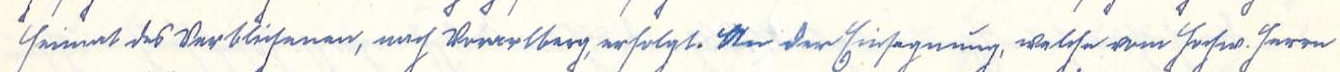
Heimat des Verblichenen, nach Vorarlberg, erfolgt. Von der Einsegnung, welche vom Hochw. Herrn
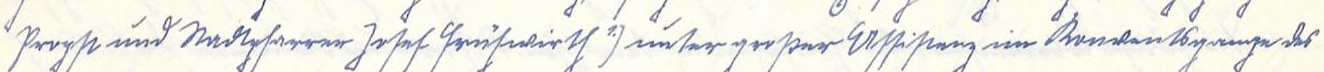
Probst und Stadtpfarrer Josef Frühwirth 1) unter großer Assistenz im Konventsgange des
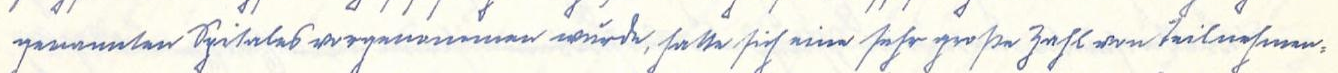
genannten Spitals vorgenommen wurde, hatte sich eine sehr große Zahl von Teilnehmen-
